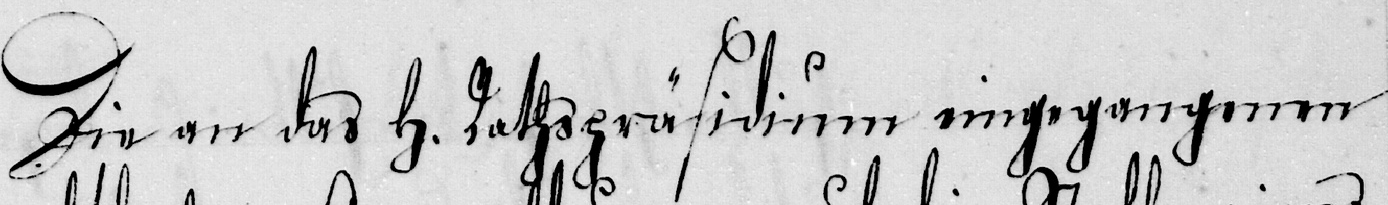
Die an das H. Rathspräsidium eingegangenen
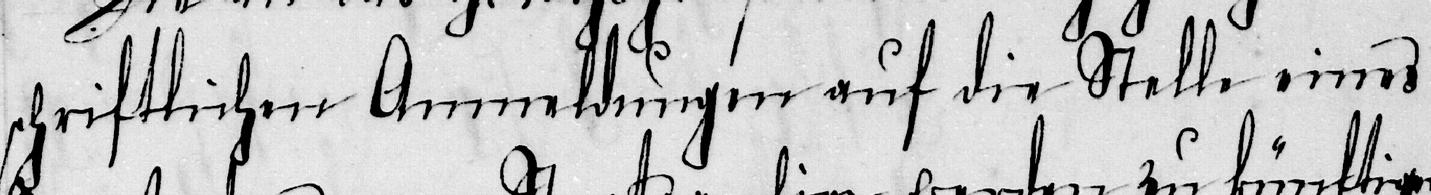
schriftlichen Anmeldungen auf die Stelle eines
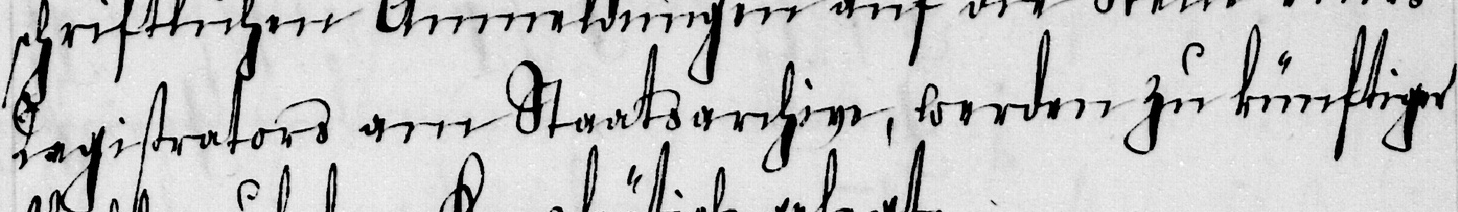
Registrators am Staatsarchive, wurden zu künftiger
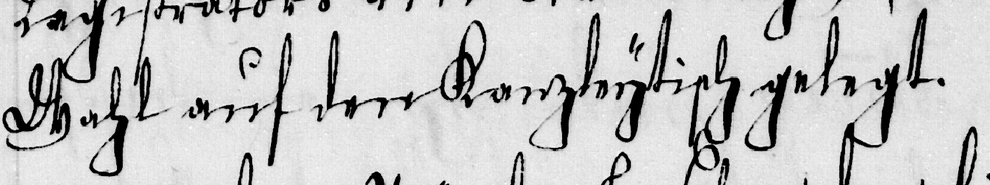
Wahl auf den Kanzleytisch gelegt.
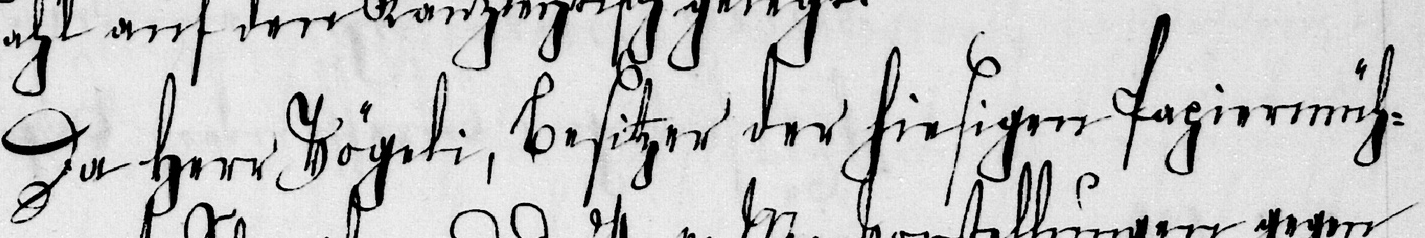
Da Herr Vögeli, Besitzer der hiesigen Papiermüh¬
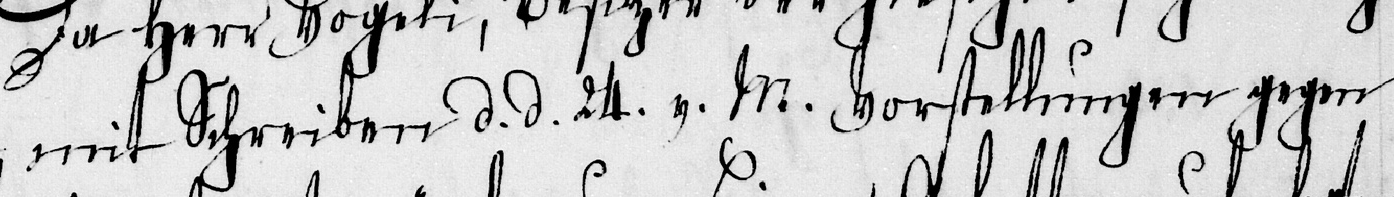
mit Schreiben d. d. 24. v. M. Vorstellungen gegen
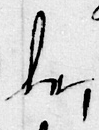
le,
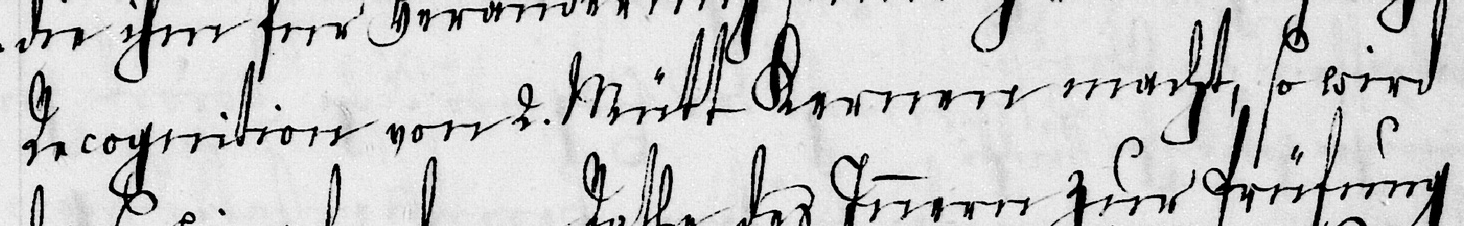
Recognition von 2. Mütt Kernen macht, so wird
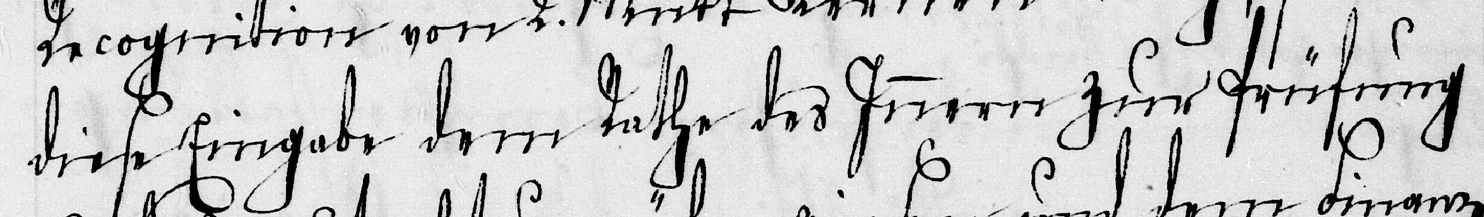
diese Eingabe dem Rathe des Innern zur Prüfung
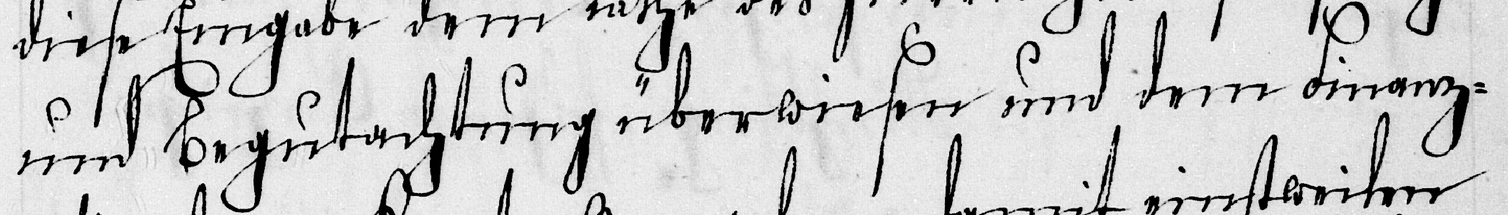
und Begutachtung überwiesen und dem Finanz¬
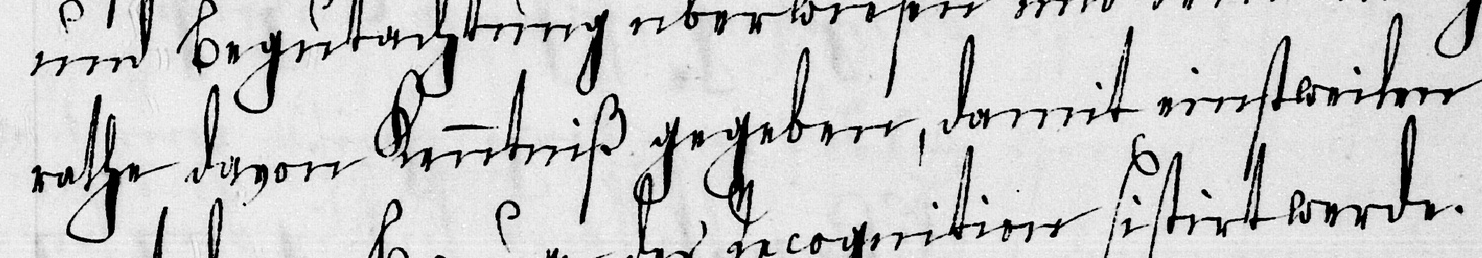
rathe davon Kenntniß gegeben, damit einstweilen
